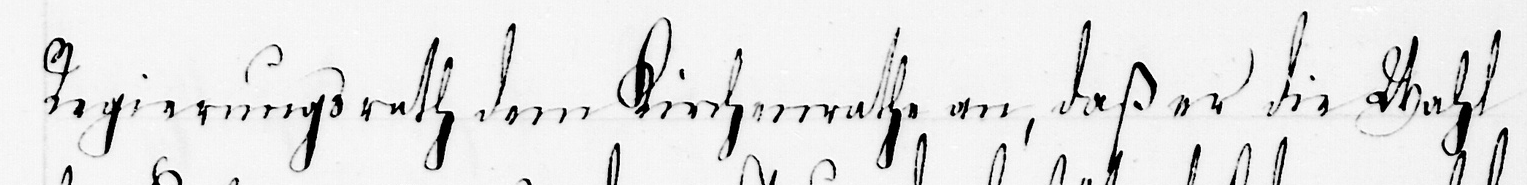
Regierungsrath dem Kirchenrathe an, daß er die Wahl
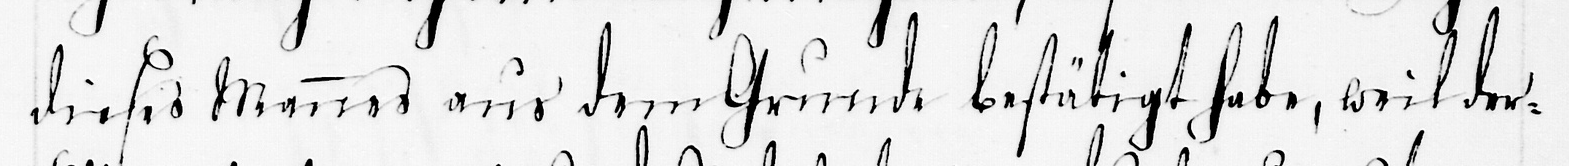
dieses Mannes aus dem Grunde bestätigt habe, weil der¬
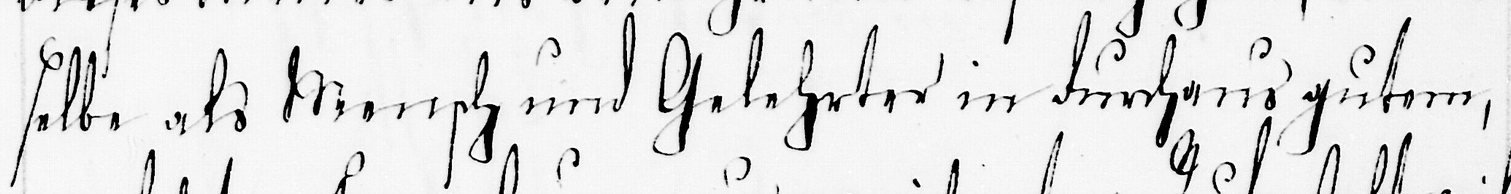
selbe als Mensch und Gelehrter in durchaus gutem,
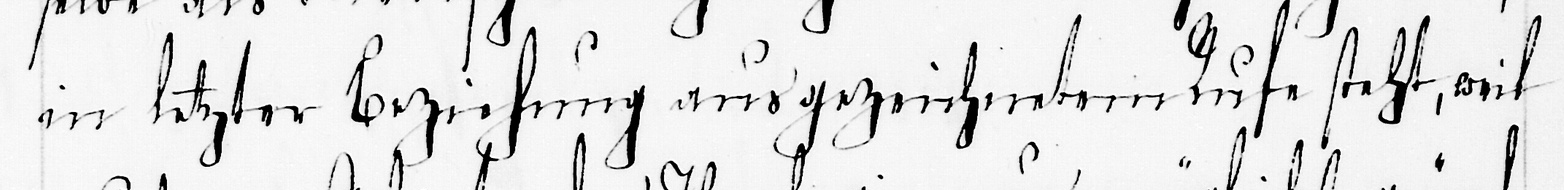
in letzter Beziehung ausgezeichnetem Rufe steht, weil
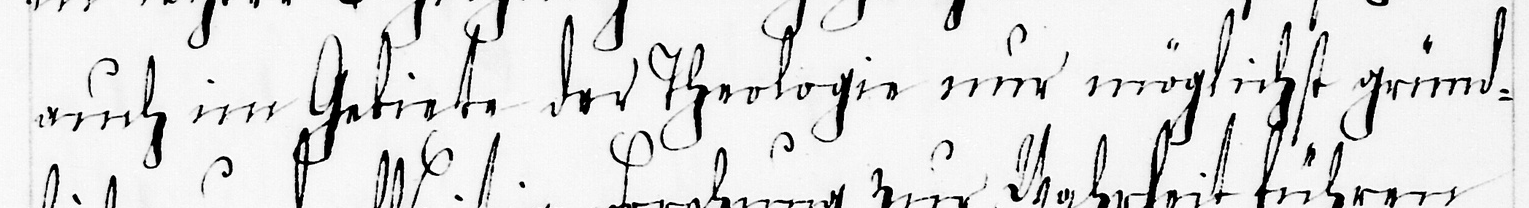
auch im Gebiete der Theologie nur möglichst gründ¬
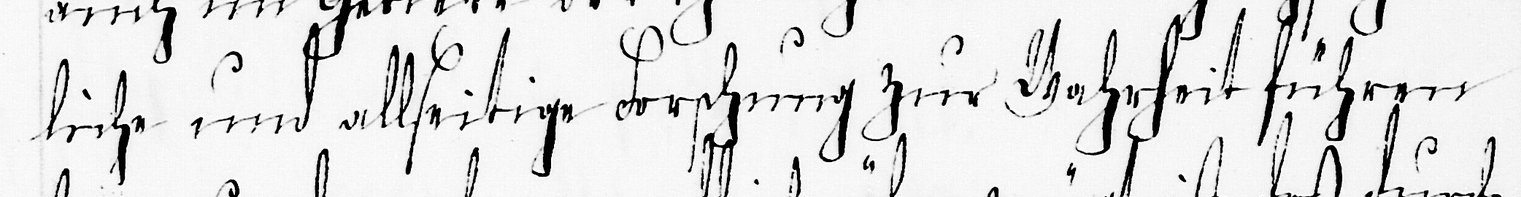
liche und allseitige Forschung zur Wahrheit führen
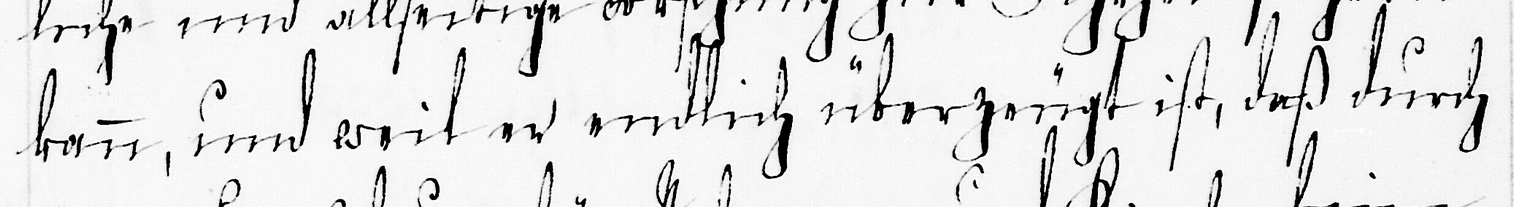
kann, und weil er endlich überzeugt ist, daß durch
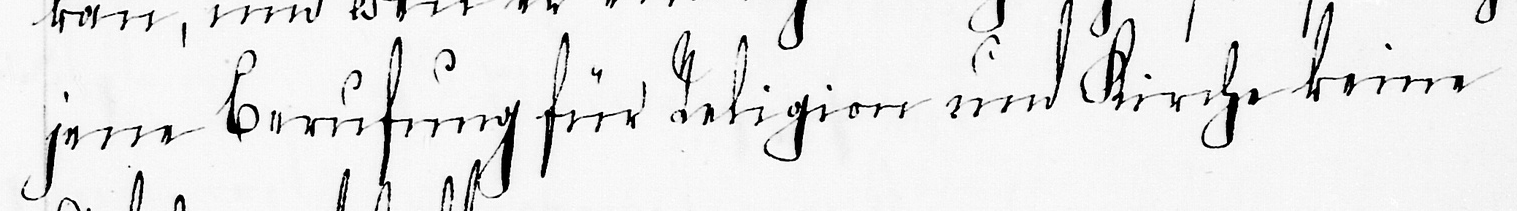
jene Berufung für Religion und Kirche keine
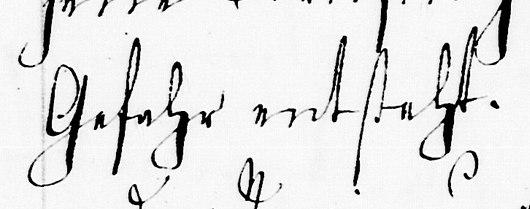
Gefahr entsteht.
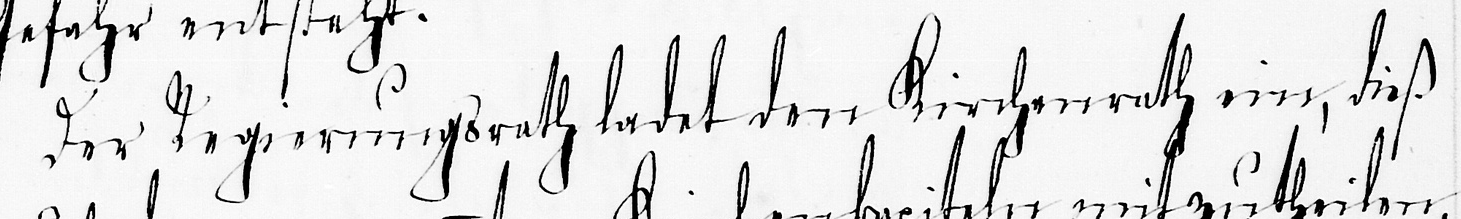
Der Regierungsrath ladet den Kirchenrath ein, dieß
